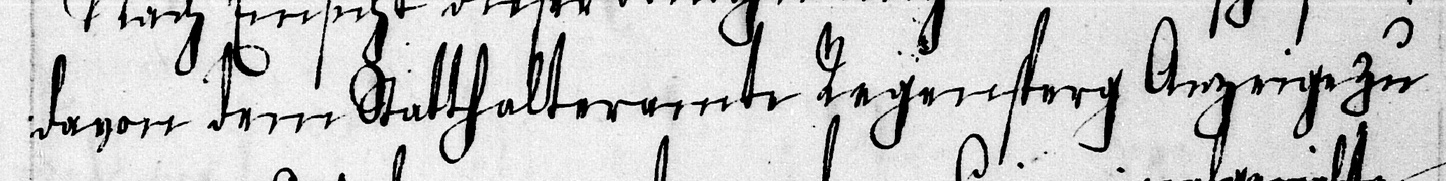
davon dem Statthalteramte Regensperg Anzeige zu
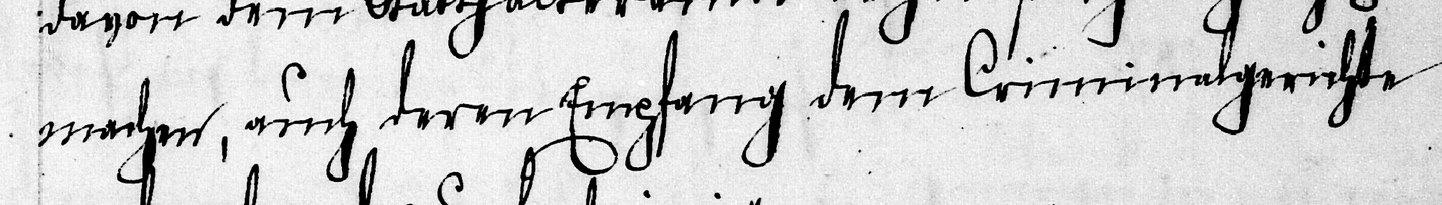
machen, auch deren Empfang dem Criminalgerichte
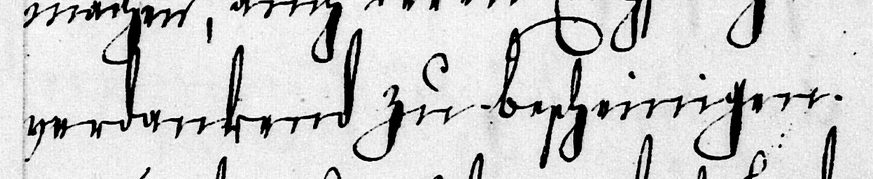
verdankend zu bescheinigen.
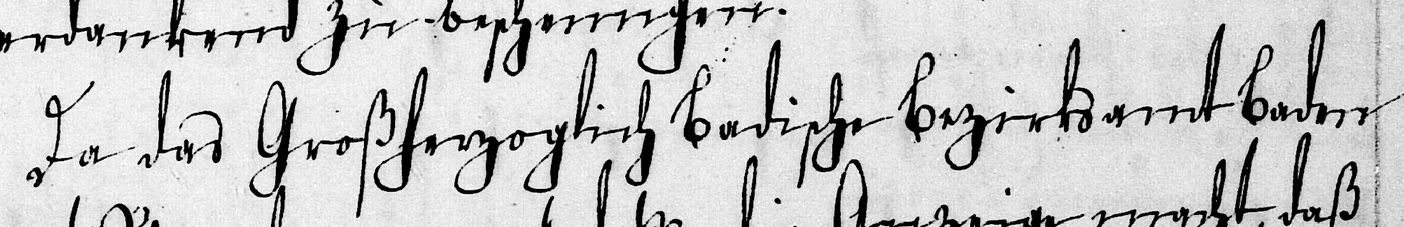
Da das Großherzoglich Badische Bezirksamt Baden
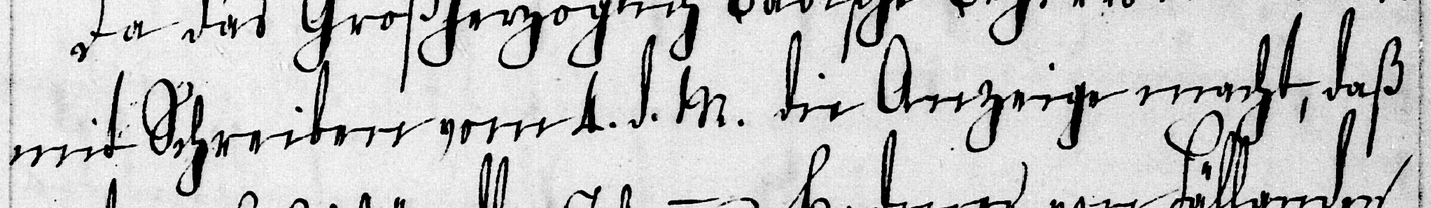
mit Schreiben vom 4. d. M. die Anzeige macht, daß
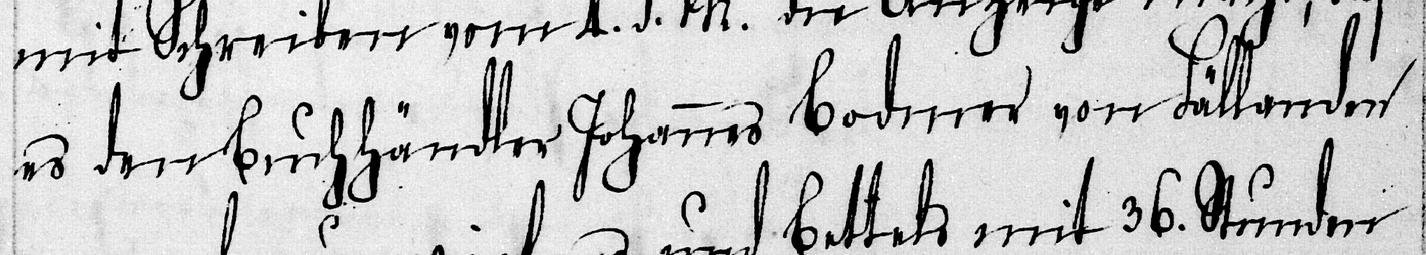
es den Buchhändler Johannes Bodmer von Fällanden
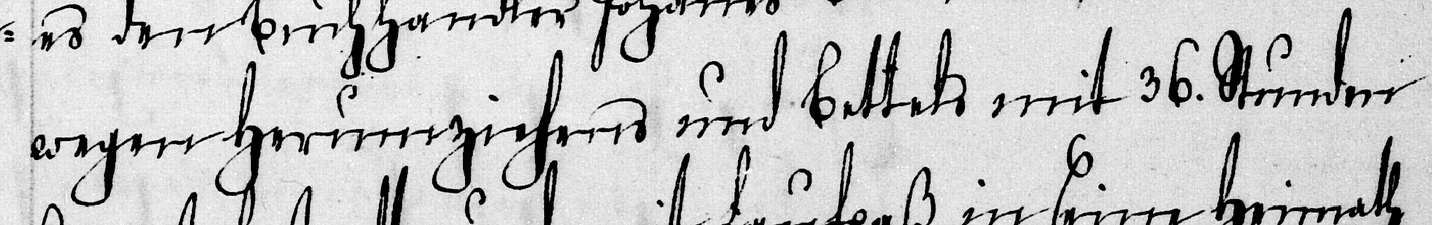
wegen Herumziehens und Bettels mit 36 .Stunden
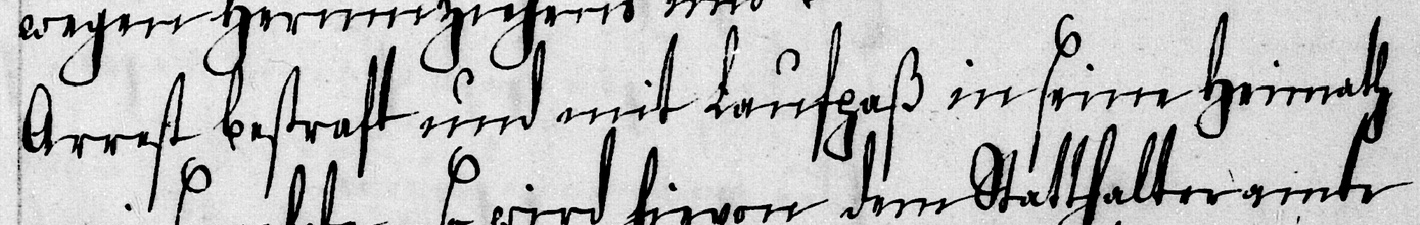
Arrest bestraft und mit Laufpaß in seine Heimath
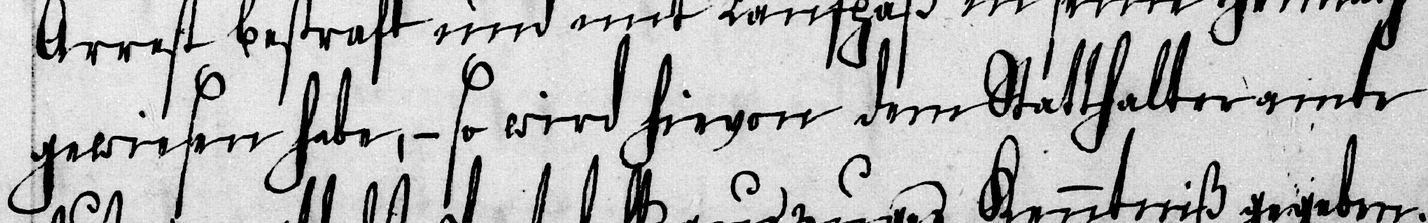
gewiesen habe, – so wird hievon dem Statthalteramte
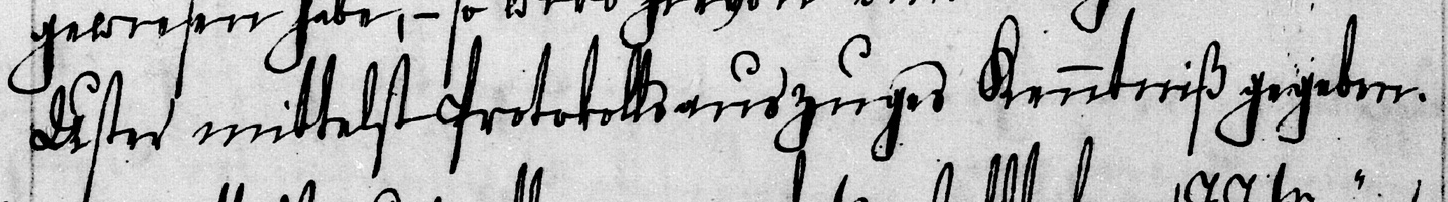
Uster mittelst Protokollsauszuges Kenntniß gegeben.
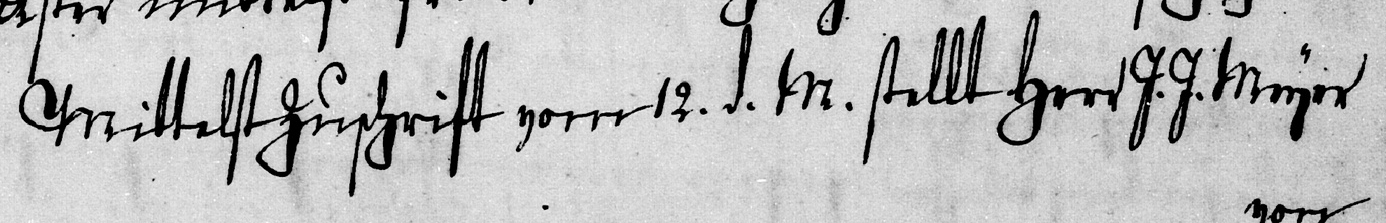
Mittelst Zuschrift vom 12. d. M. stellt Herr J. J. Meyer
